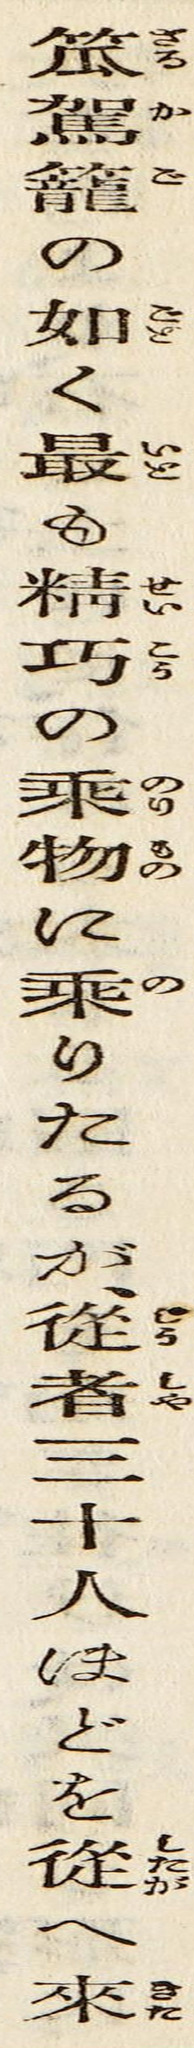笟駕籠の如く最も精巧の乗物に乗りたるが、従者三十人ほどを従へ来
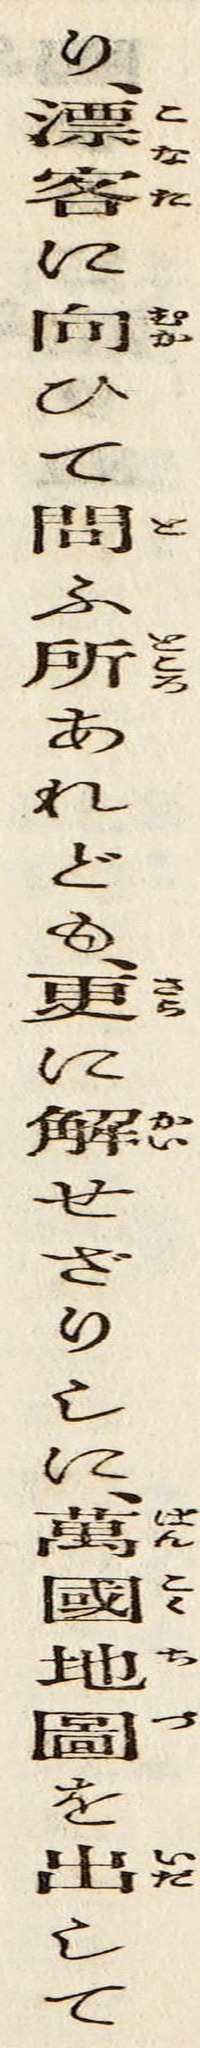り、漂客に向ひて問ふ所あれども、更に解せざりしに、万国地図を出して
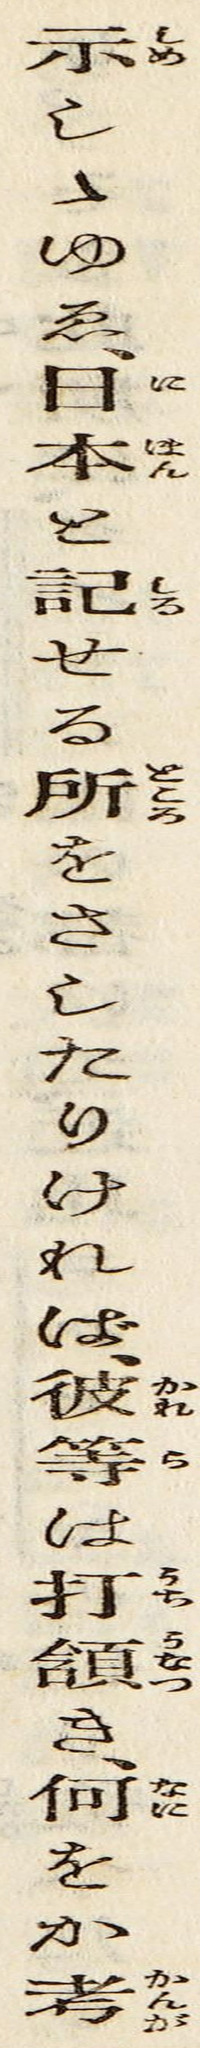示しゝゆゑ、日本と記せる所をさしたりければ、彼等は打頷き、何をか考
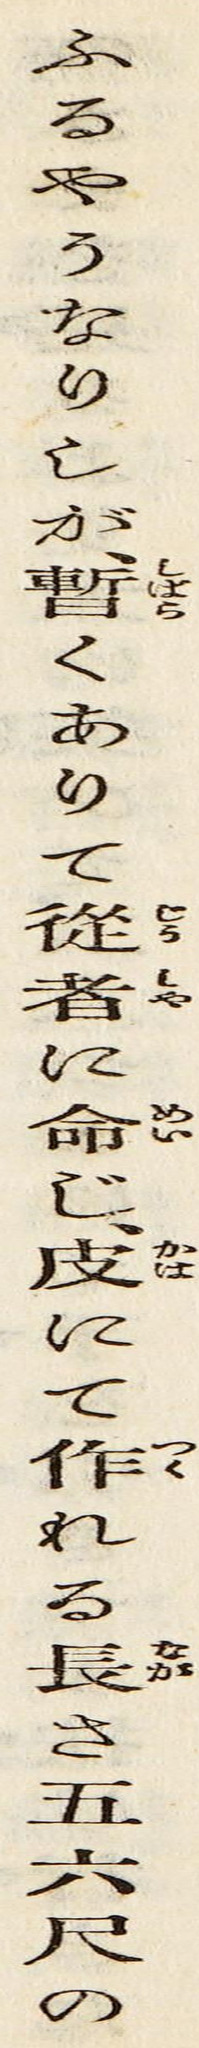ふるやうなりしが、暫くありて従者に命じ、皮にて作れる長さ五六尺の
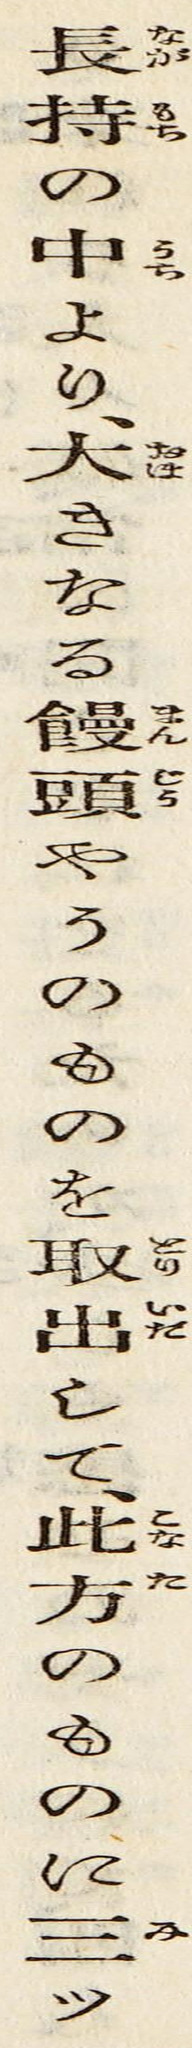長持の中より、大きなる饅頭やうのものを取出して、此方のものに三ツ
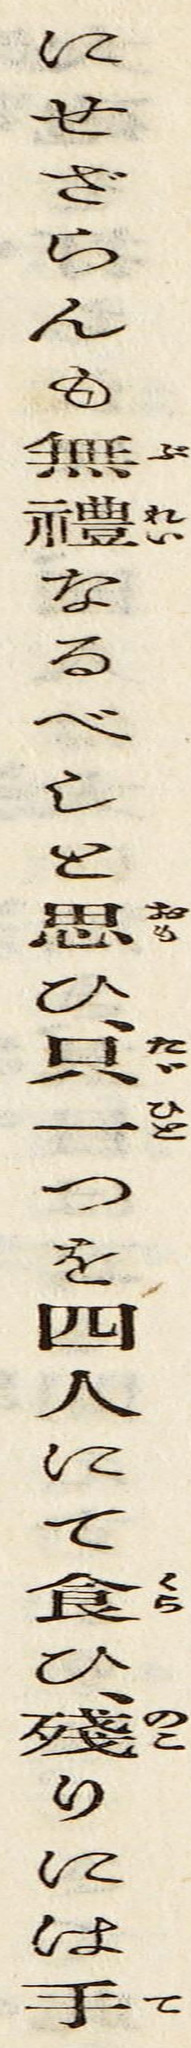にせざらんも無礼なるべしと思ひ、只一つを四人にて食ひ、残りには手
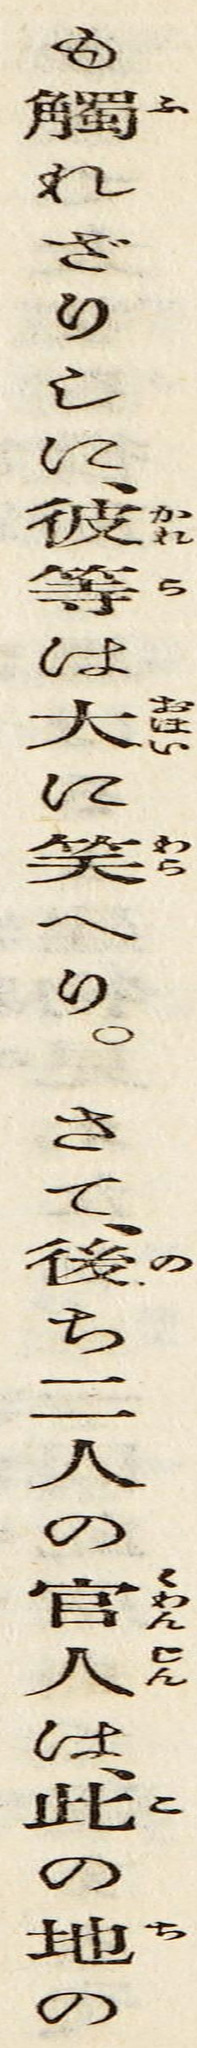も触れざりしに、彼等は大に笑へり。さて、後ち二人の官人は、此の地の
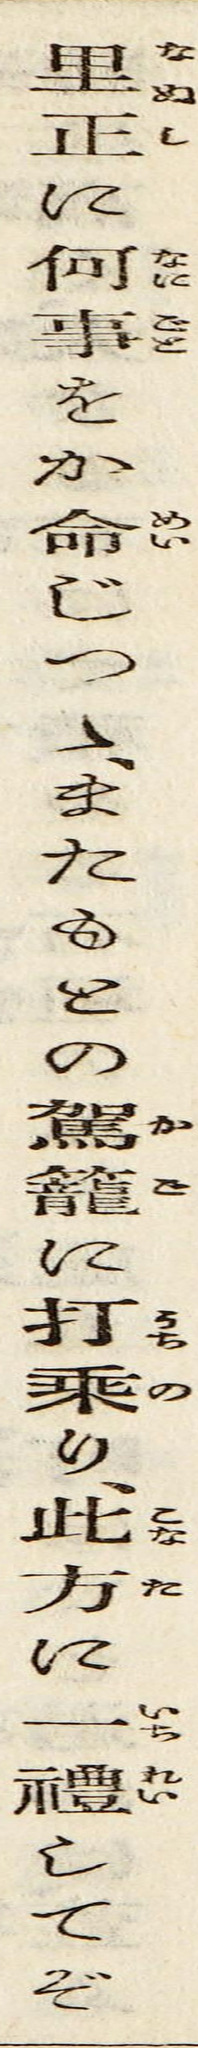里正に何事をか命じつゝ、またもとの駕籠に打乗り、此方に一礼してぞ
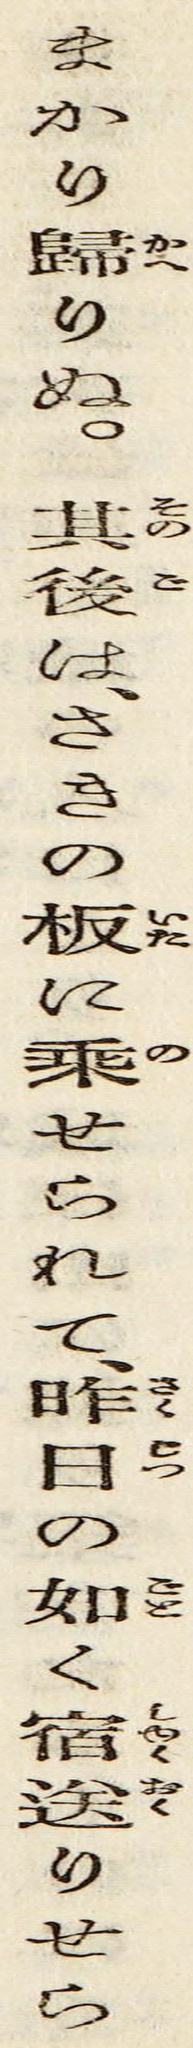まかり帰りぬ。其後は、さきの板に乗せられて、昨日の如く宿送りせら
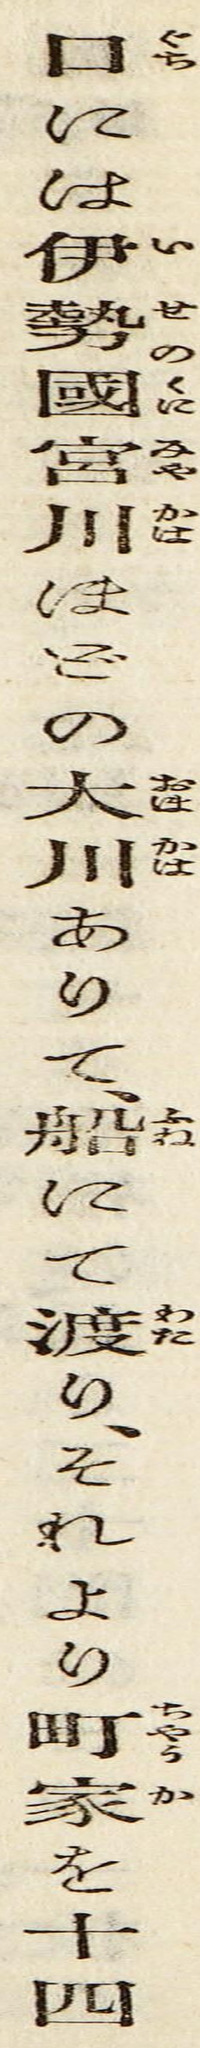口には伊勢国宮川ほどの大川ありて、船にて渡り、それより町家を十四

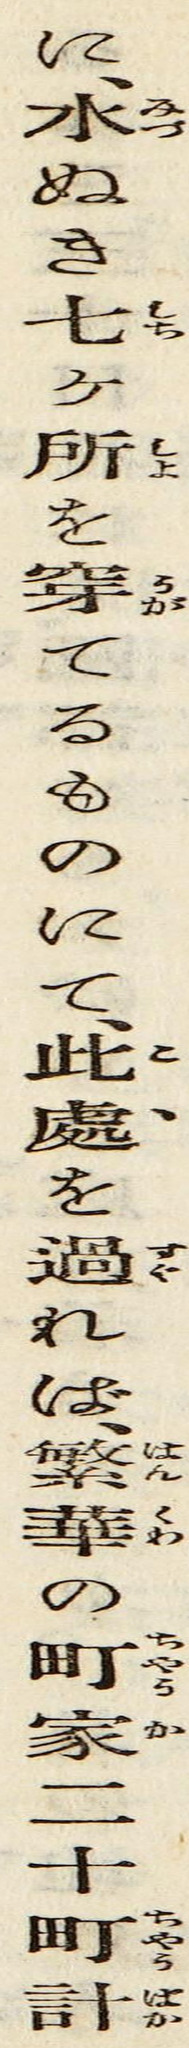に、水ぬき七ケ所を穿てるものにて、此処を過れば、繁華の町家二十町計
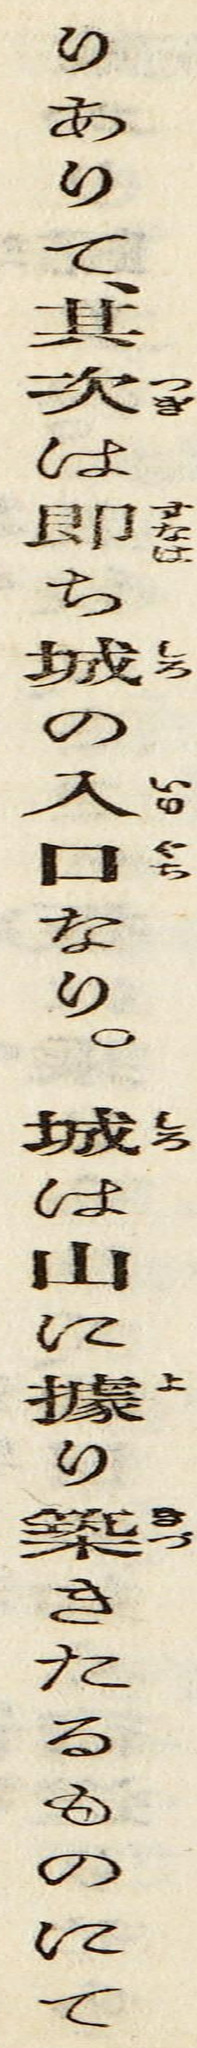りありて、其次は即ち城の入口なり。城は山に拠り築きたるものにて
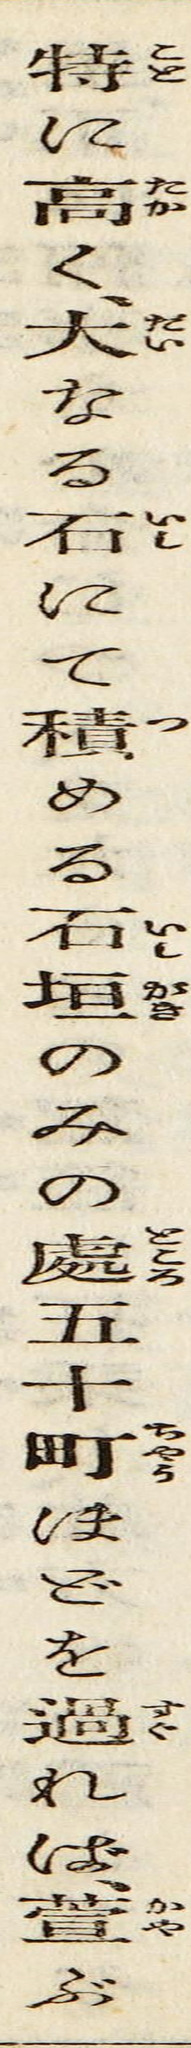特に高く、大なる石にて積める石垣のみの処五十町ほどを過れば、萱ぶ
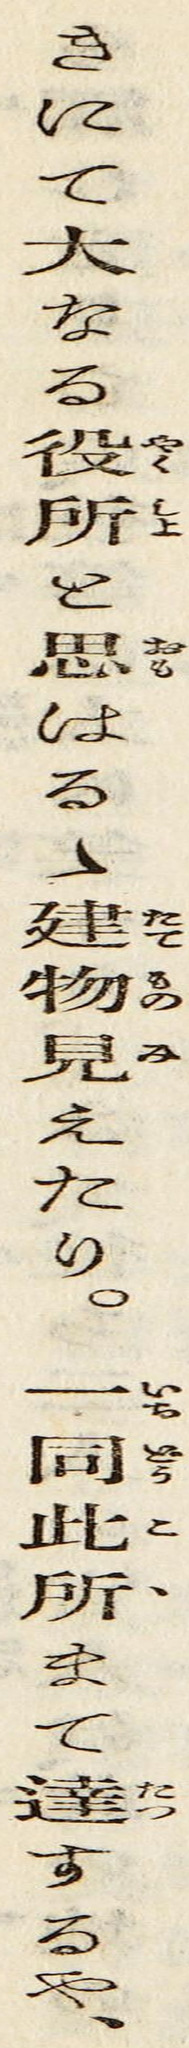きにて大なる役所と思はるゝ建物見えたり。一同此所まて達するや、
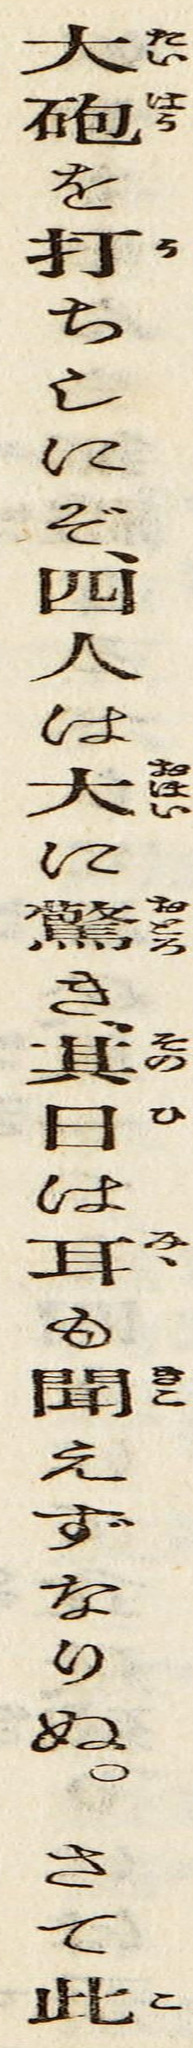大砲を打ちしにぞ、四人は大に驚き、其日は耳も聞えずなりぬ。さて此
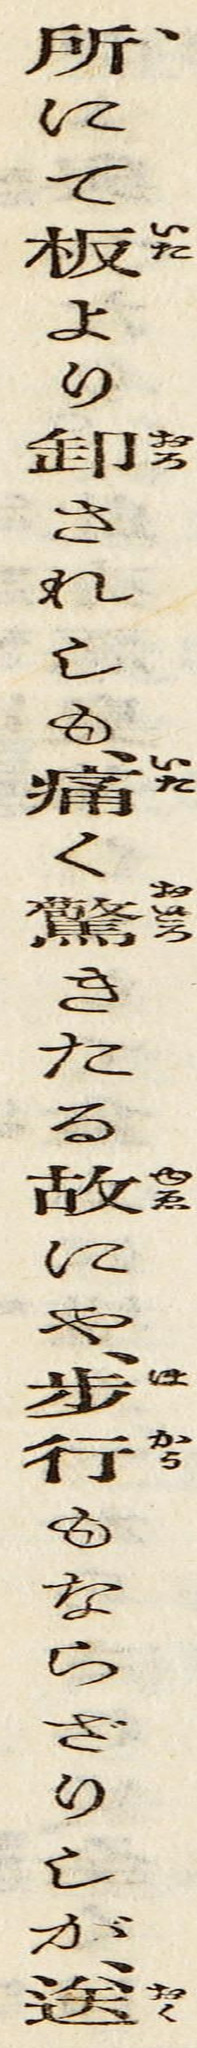所にて板より卸されしも、痛く驚きたる故にや、歩行もならざりしが、送
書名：日本漂流譚
